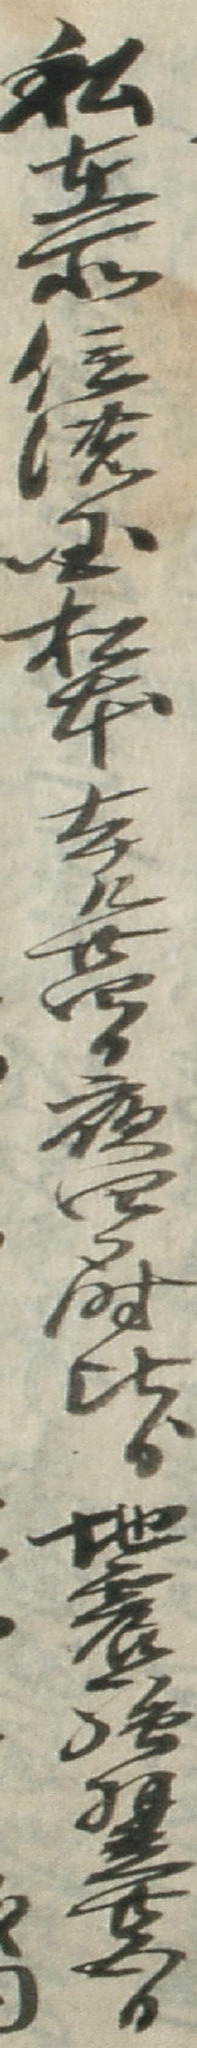私在所信濃国松本去ㇽ廿四日夜四ッ時比ゟ地震強翌廿五日
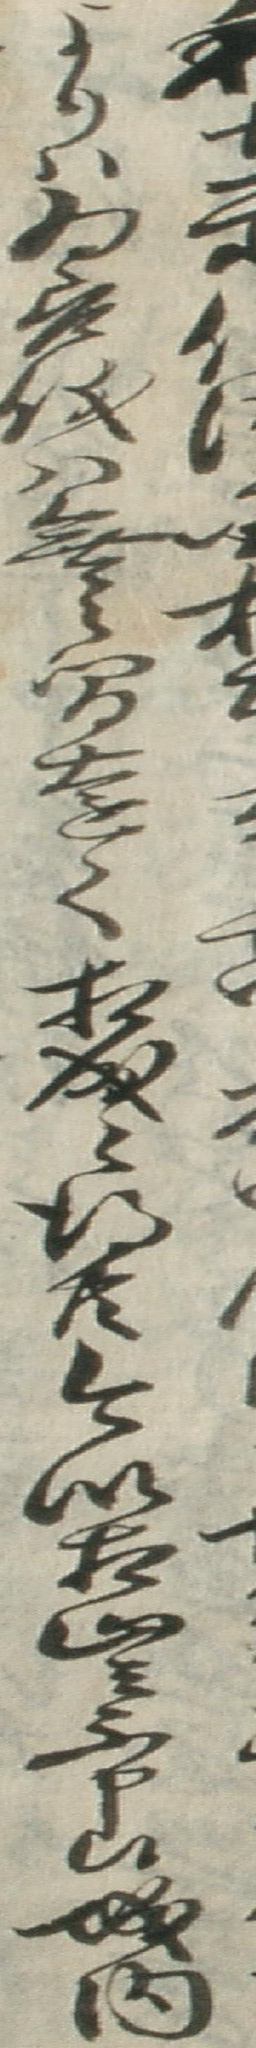よりハ為差儀ハ無之間遠相成候得共今以相止ミ不申候城内
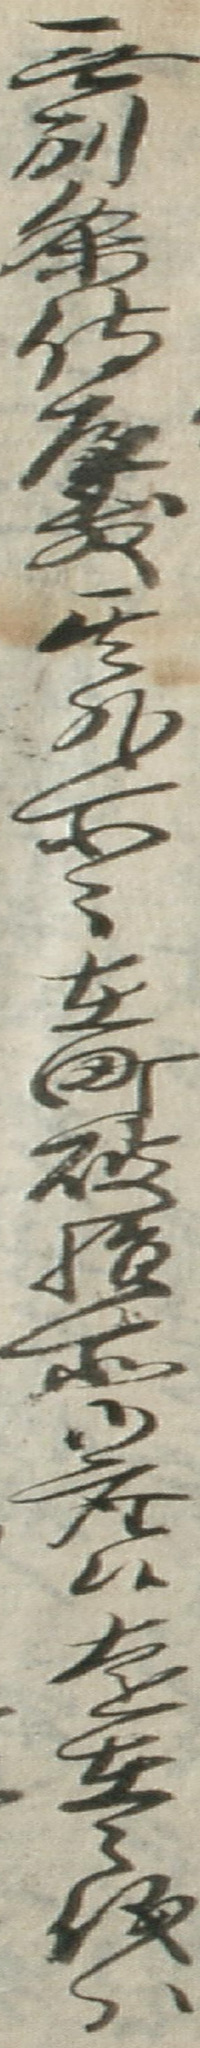無別条侍屋敷其外所々在町破損所御座候遠在之儀ハ
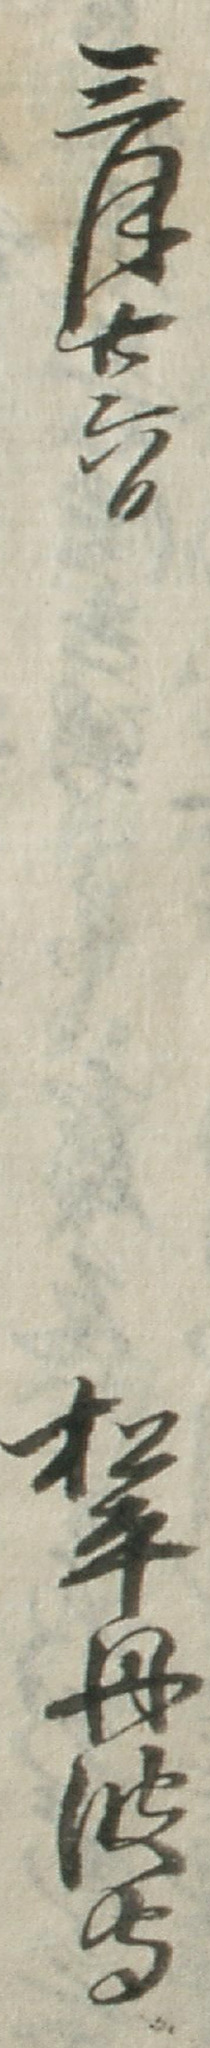三月廿六日真田信濃守
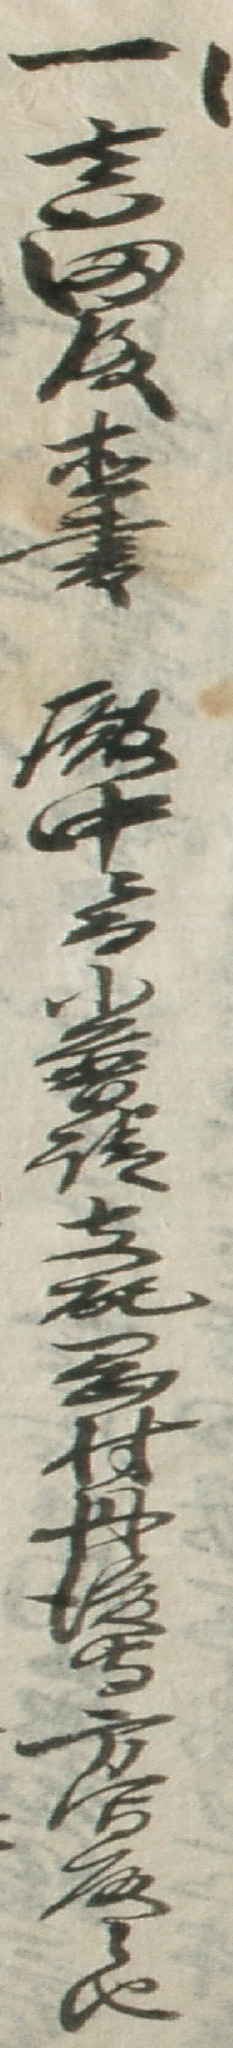一真田殿直書殿中二而小普請支配岡村丹後守方写取候由
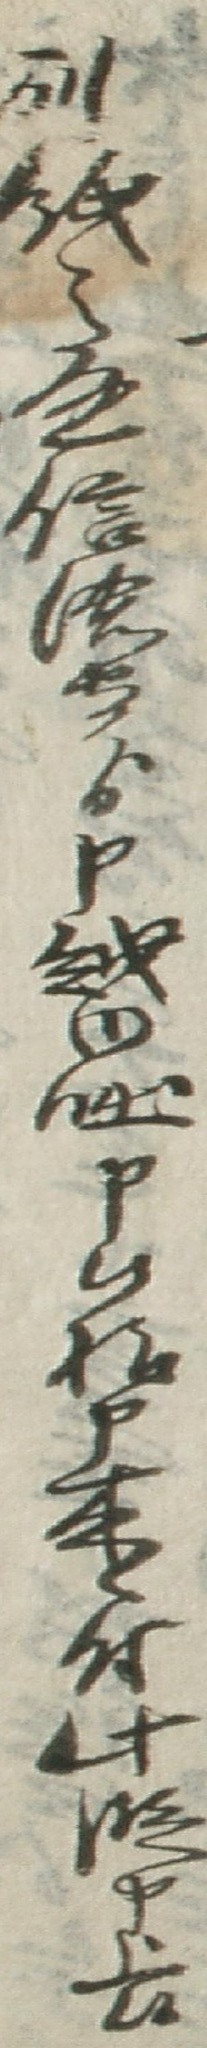別紙之通信濃守ゟ申越御咄申候様申来候二付此段申上候
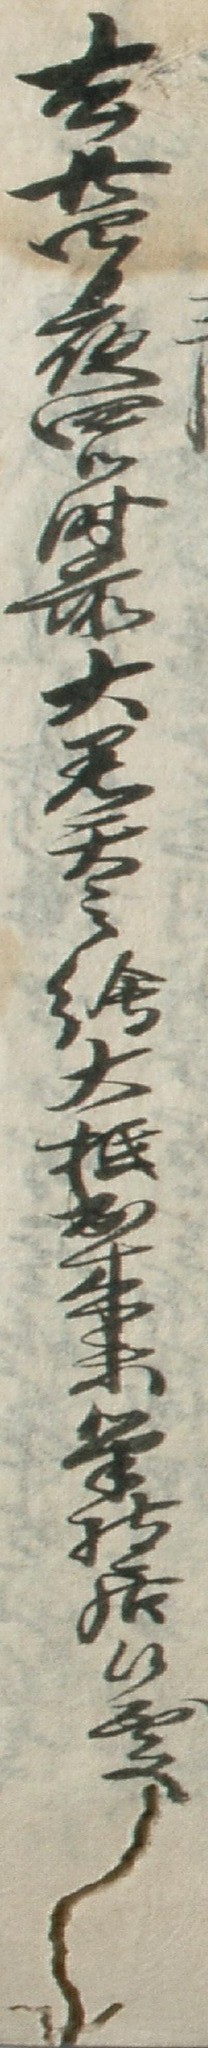去廿四日夜四ツ時前大黒天之絵大抵出来未筆持居候処

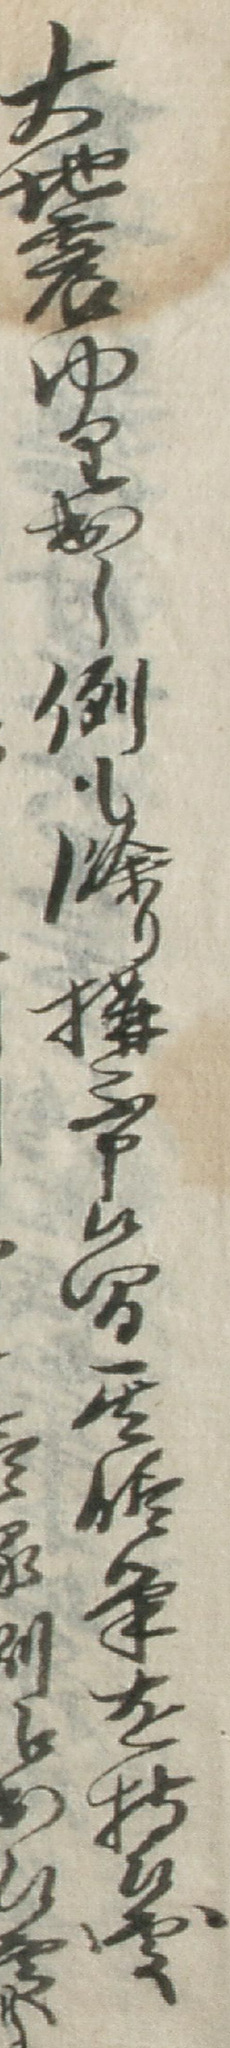大地震ゆり出し倒も餘り構不申候間其侭筆を持候処
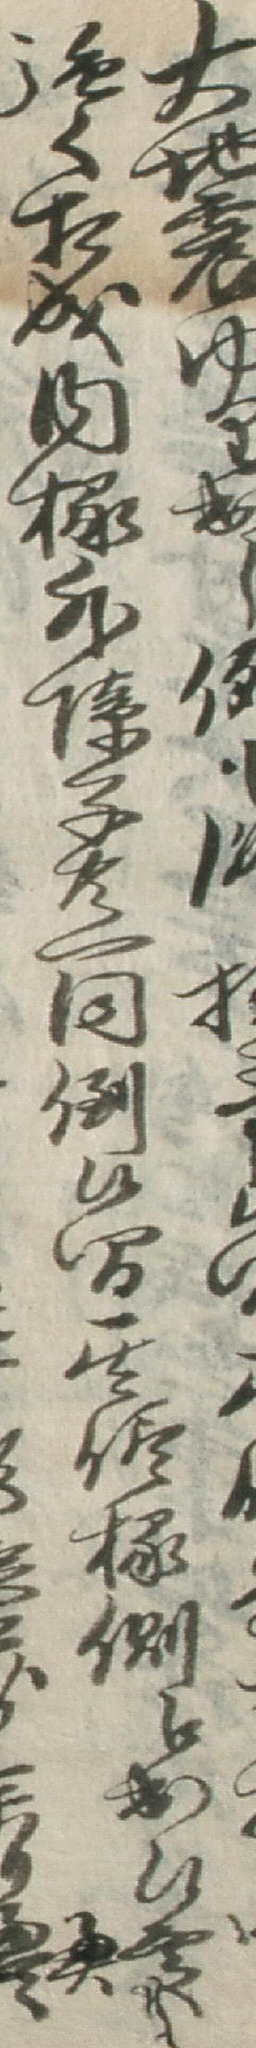強く相成内縁外障子共一同倒候間其侭縁側江出候処
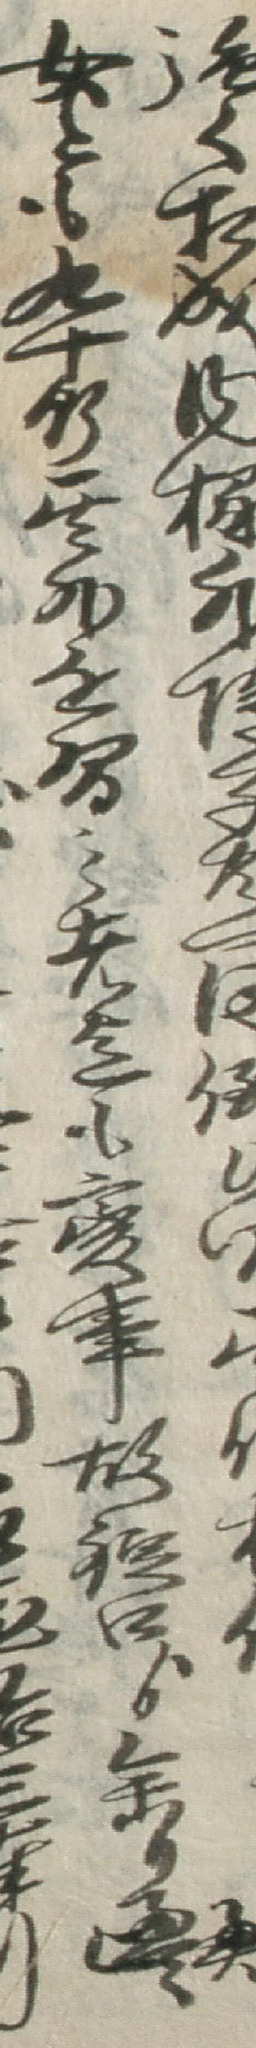女とも九十郎其外近間之者迄も変事故錠口ゟ参り奥
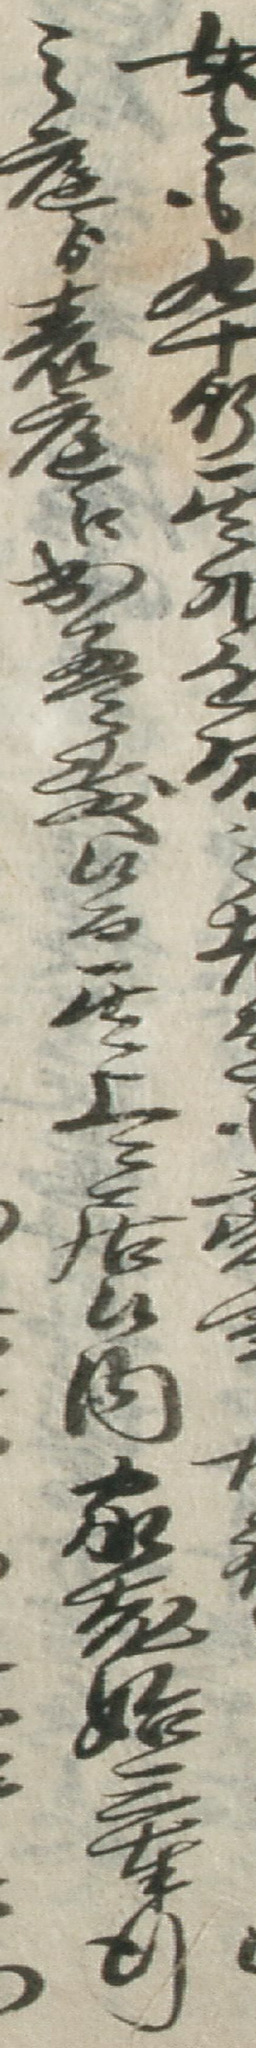之庭ゟ表庭江出畳敷候而其上二居候内家老始三奉行
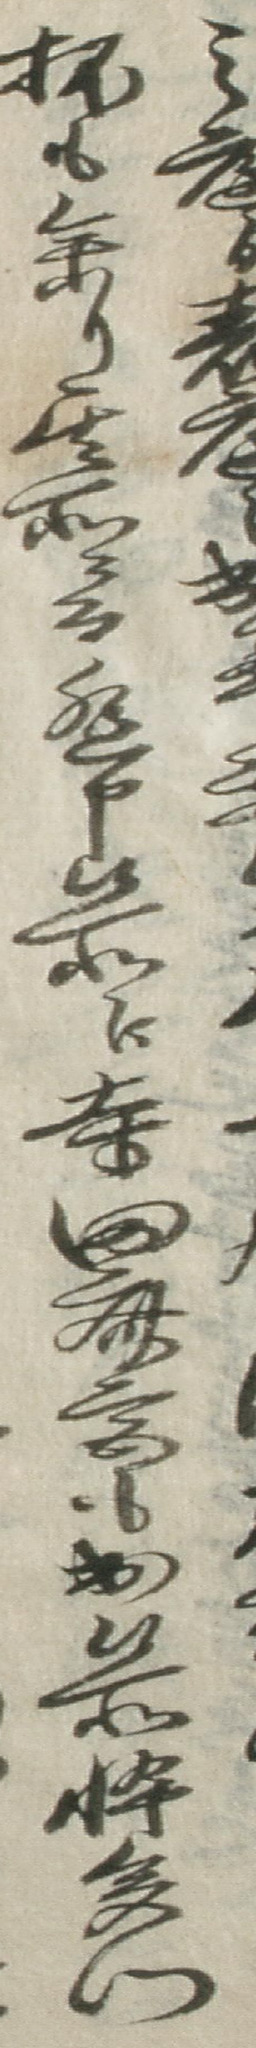抔も参り其所二而逢申所江寺田斉宮も出候所忰多門
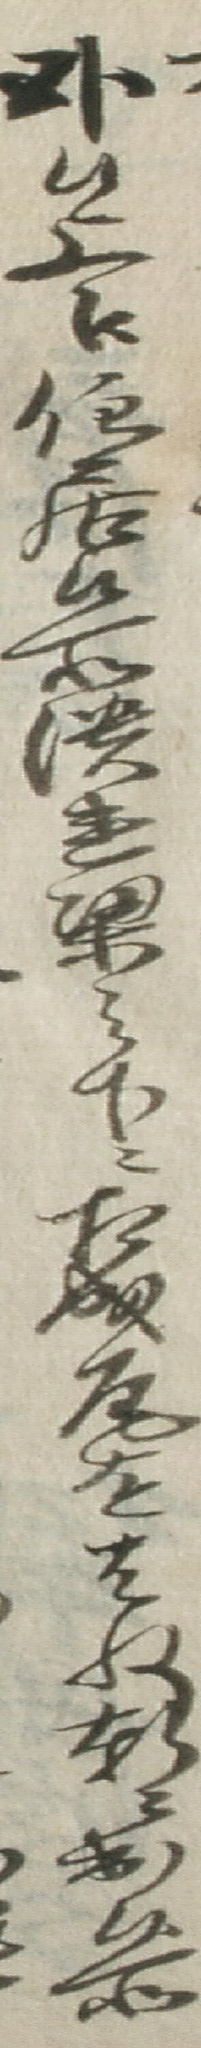臥候上江住居候所潰れ梁之下二相成瓦をはね軒二出候所
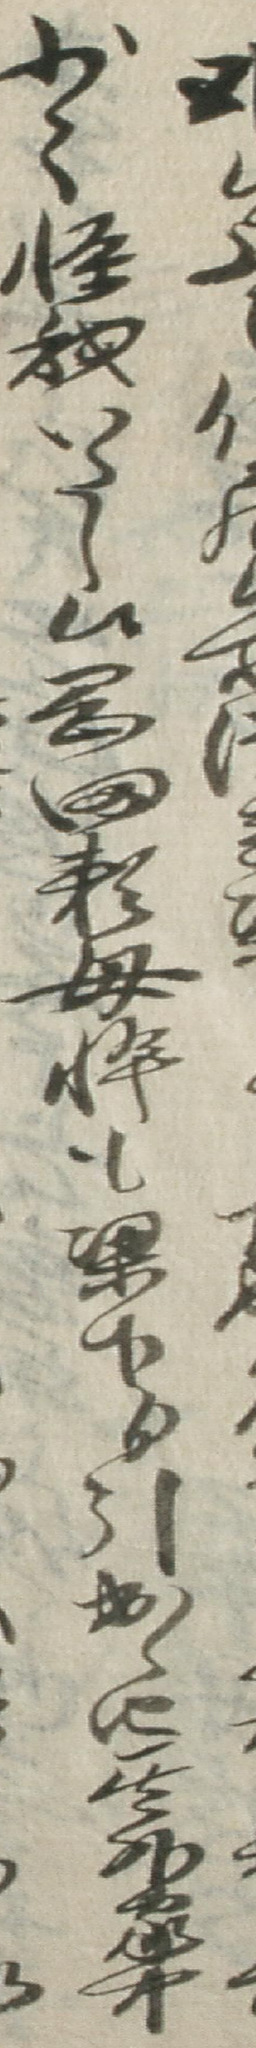少々怪我いたし候恩田頼母忰も梁下ゟ引出候由其外家中
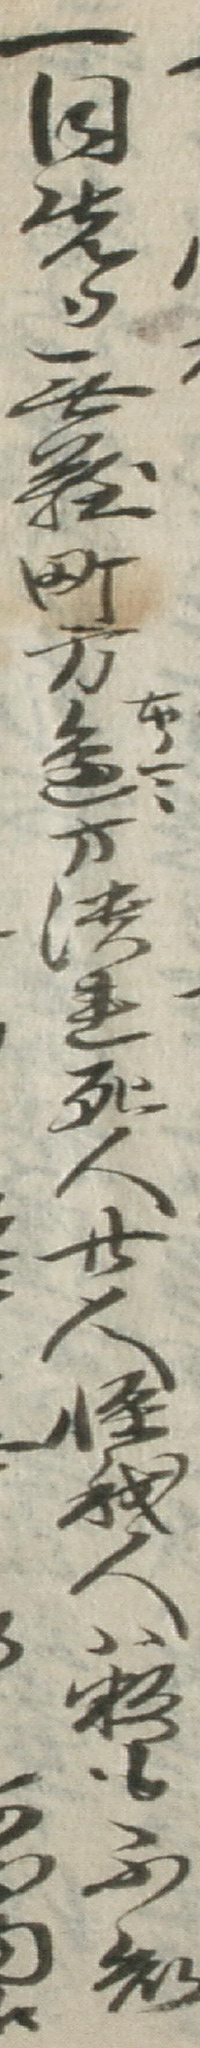一同先ッ無難町方遠方潰れ死人廿人怪我人ハ数も不知
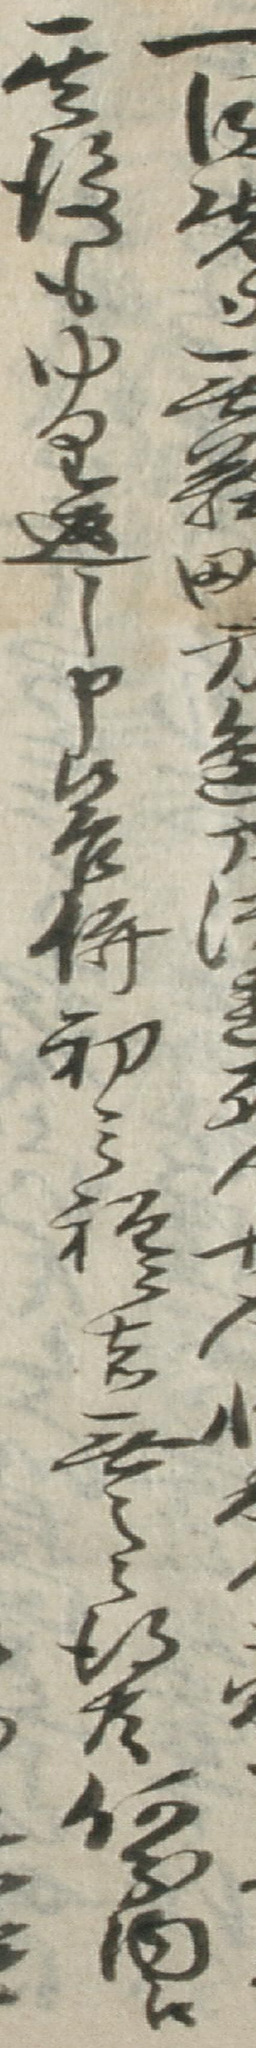其後もゆり返し申候乍併初之程二は無之候得共何分内江
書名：信濃國地震實録記
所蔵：東京大学地震研究所図書室 Earthquake Research Institute Library, The University of Tokyo, JAPAN
